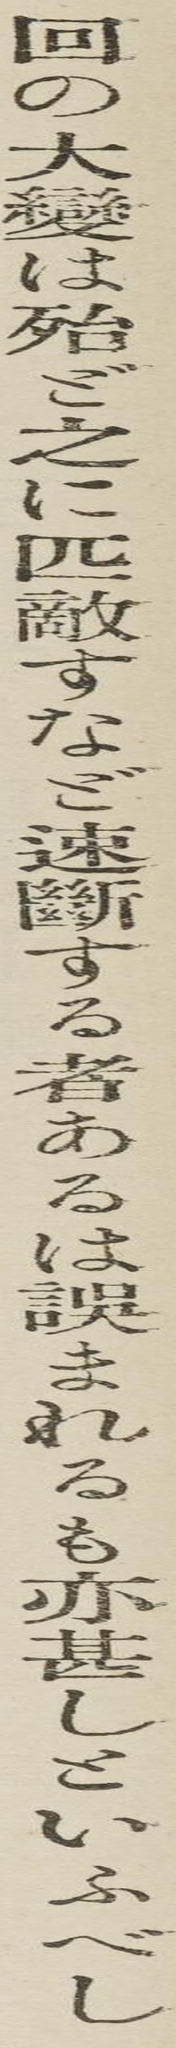回の大変は殆ど之に匹敵すなど速断する者あるは誤まれるも亦甚しといふべし
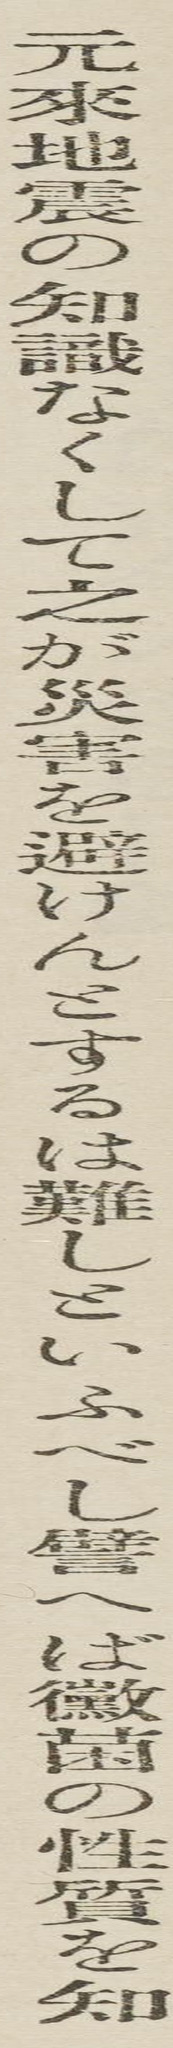元来地震の知識なくして之が災害を避けんとするは難しといふべし譬へば黴菌の性質を知
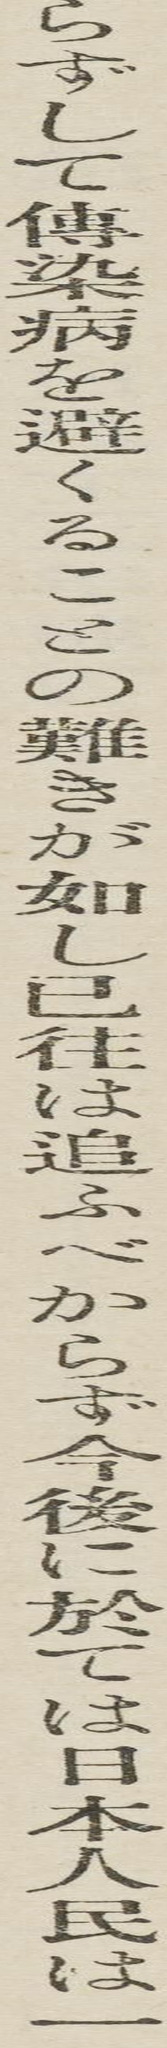らずして伝染病を避くることの難きが如し已往は追ふべからず今後に於ては日本人民は一
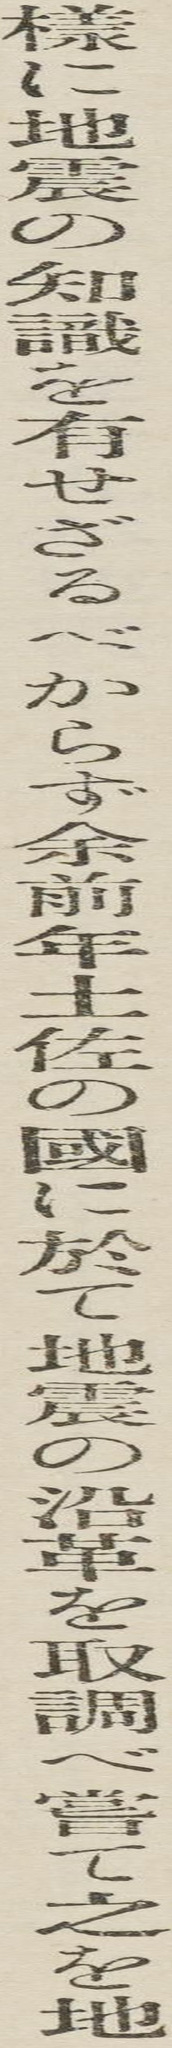様に地震の知識を有せざるべからず余前年土佐の国に於て地震の沿革を取調べ嘗て之を地
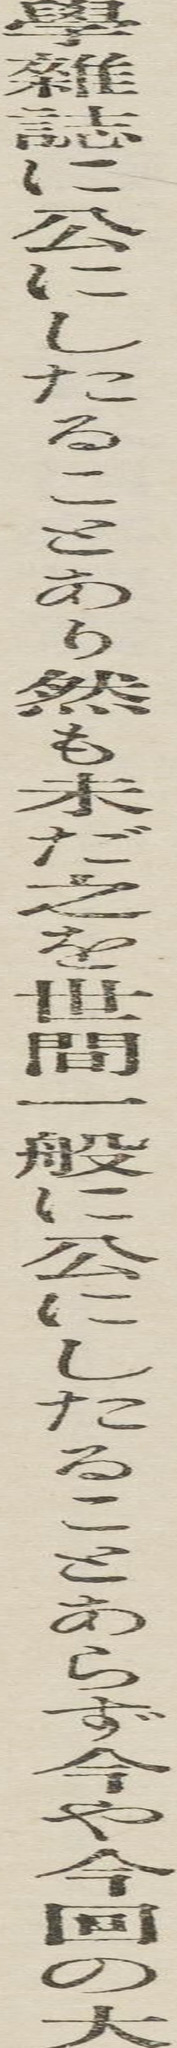学雑誌に公にしたることあり然も未だ之を世間一般に公にしたることあらず今や今回の大
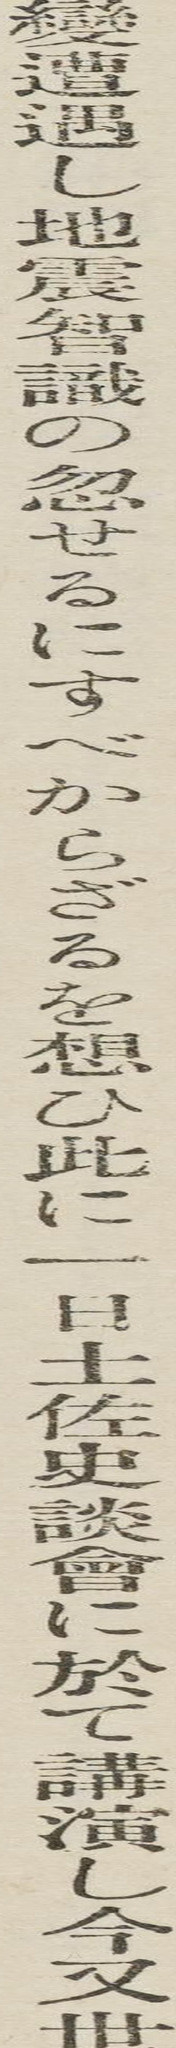変遭遇し地震智識の忽せるにすべからざるを想ひ此に一日土佐史談会に於て講演し今又世
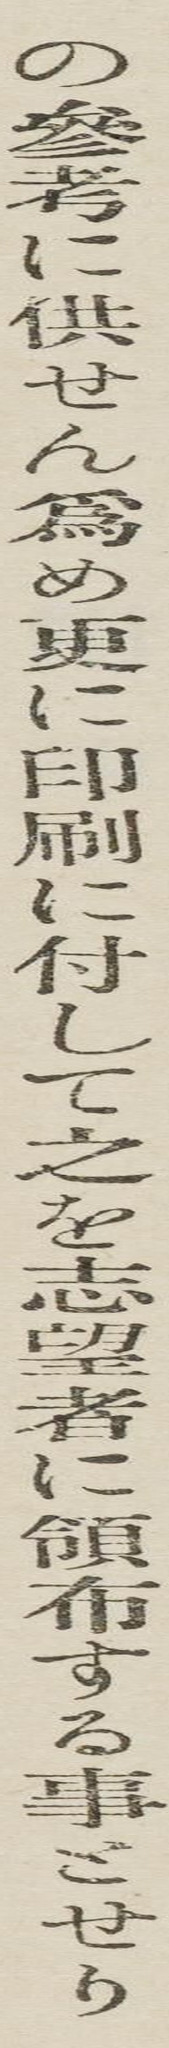の参考に供せん為め更に印刷に付して之を志望者に領布する事とせり
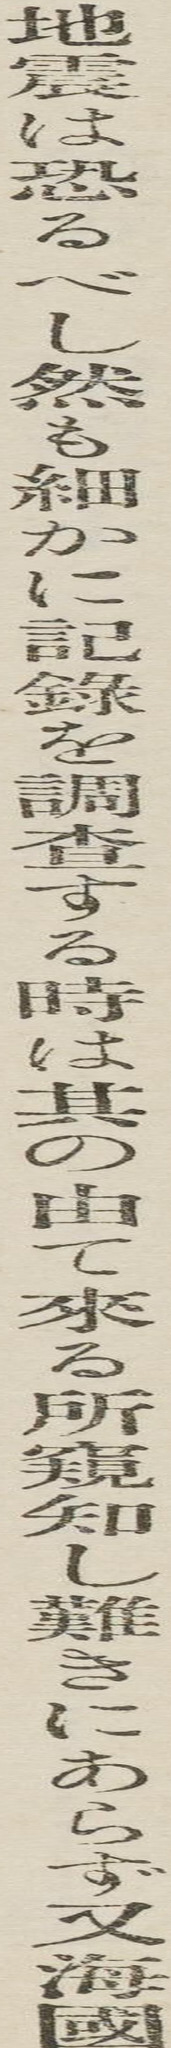地震は恐るべし然も細かに記録を調査する時は其の由て来る所窺知し難きにあらず又海国
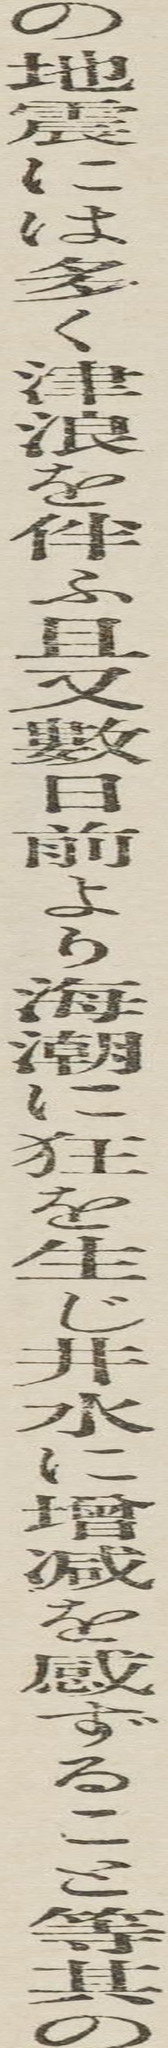の地震には多く津浪を伴ふ且又数日前より海潮に狂を生じ井水に増減を感ずること等其の
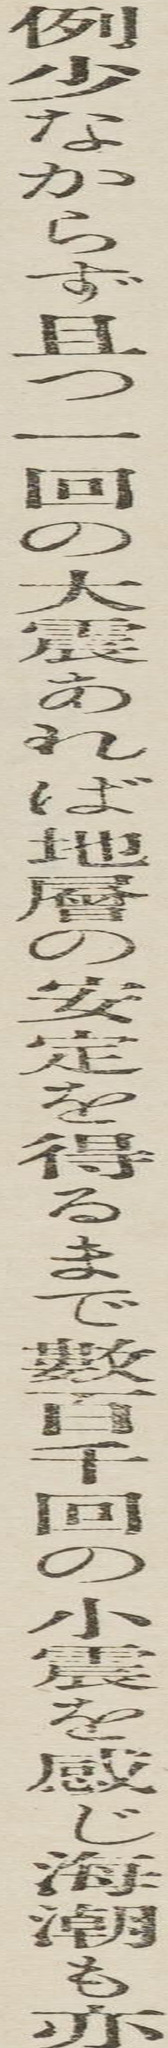例少なからず且つ一回の大震あれば地層の安定を得るまで数百千回の小震を感じ海潮も亦
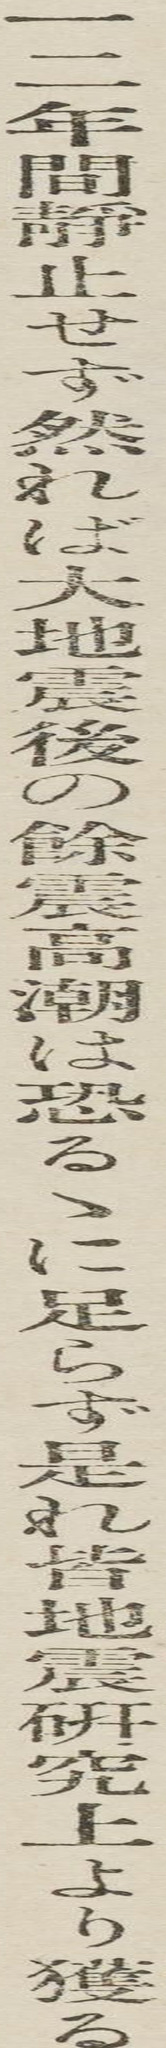一二年間静止せず然れば大地震後の余震高潮は恐るゝに足らず是れ皆地震研究上より獲る
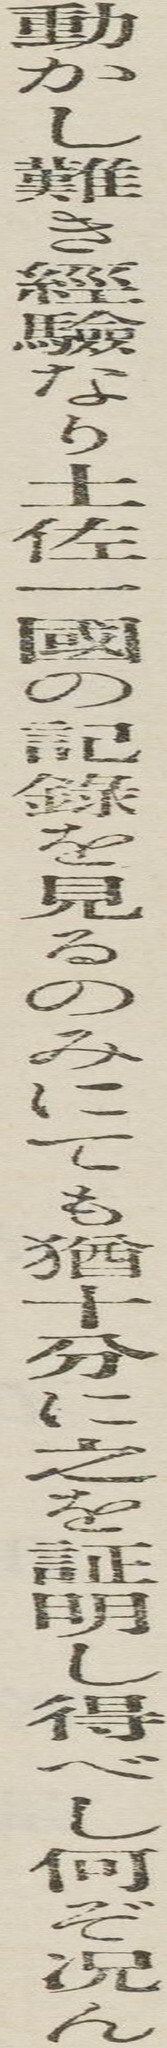動かし難き経験なり土佐一国の記録を見るのみにても猶十分に之を証明し得べし何ぞ況ん
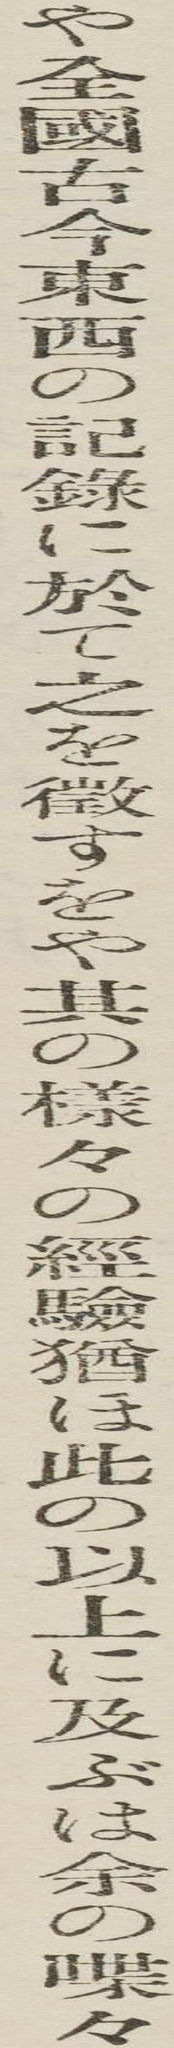や全国古今東西の記録に於て之を徴すをや其の様々の経験猶ほ此の以上に及ぶは余の喋々
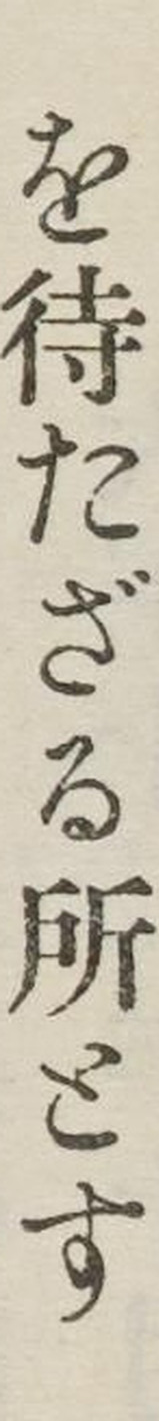を待たざる所とす
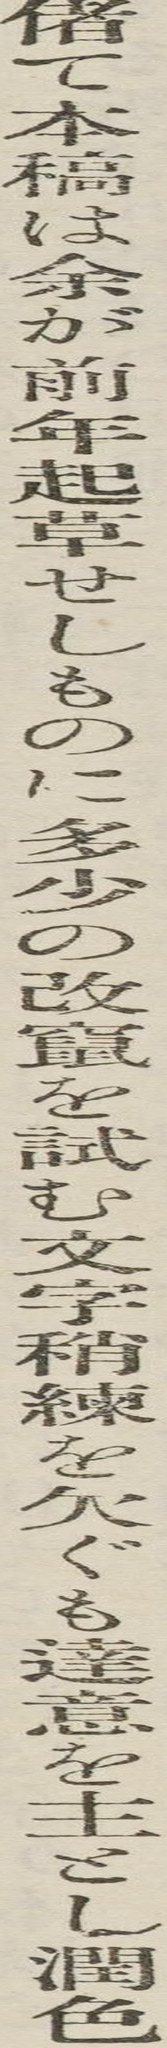偖て本稿は余が前年起草せしものに多少の改竄を試む文字稍練を欠ぐも達意を主とし潤色
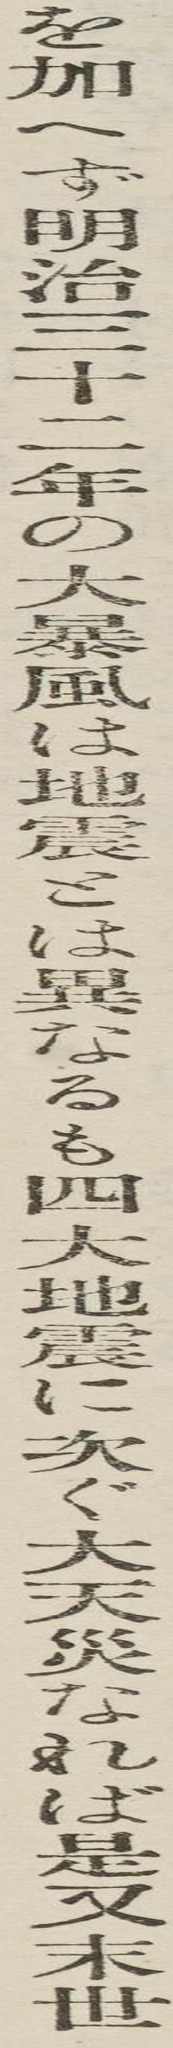を加へず明治三十二年の大暴風は地震とは異なるも四大地震に次ぐ大天災なれば是又末世
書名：土佐古今ノ地震
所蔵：東京大学地震研究所図書室 Earthquake Research Institute Library, The University of Tokyo, JAPAN
